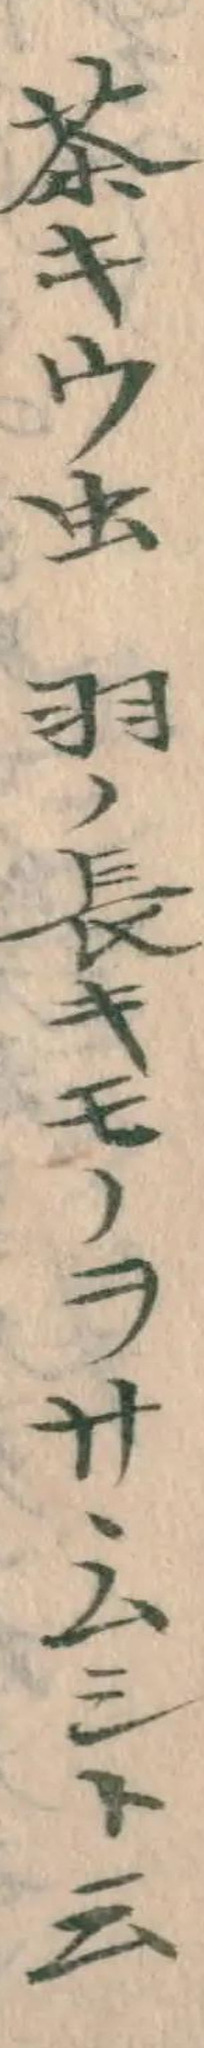茶キウ虫羽ノ長キモノヲサヽムシト云
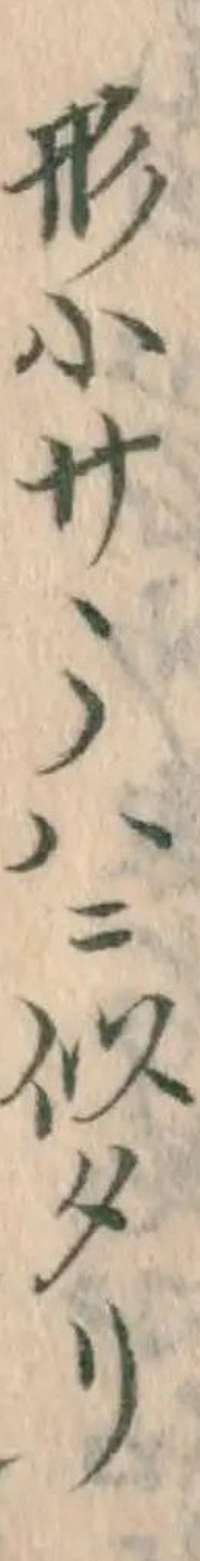形小サヽノハニ似タリ
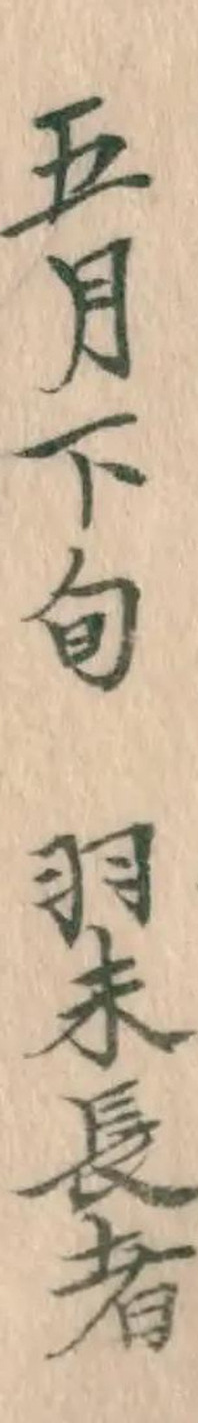五月下旬羽未長者

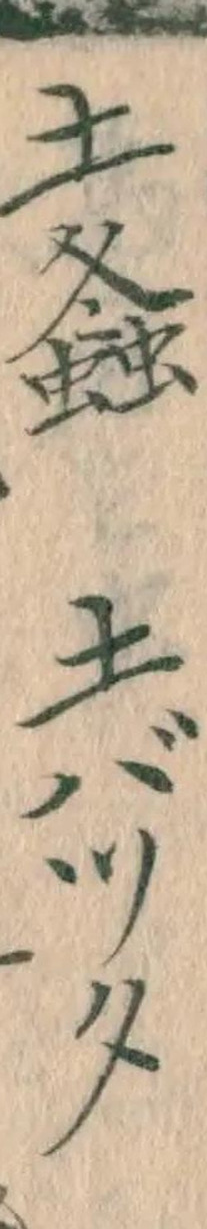土螽土バツタ
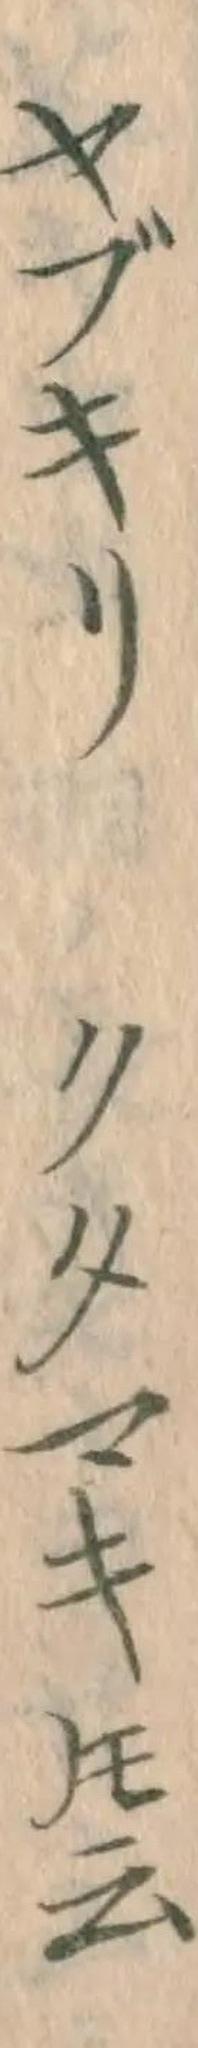ヤブキリクタマキトモ云
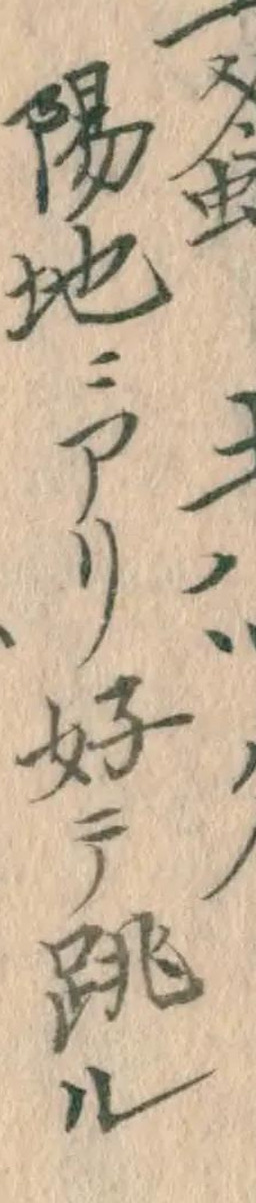陽地ニアリ好テ跳ル
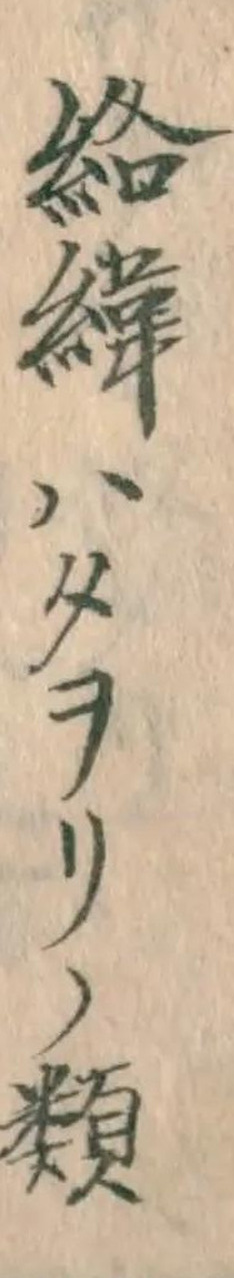絡緯ハタヲリノ類
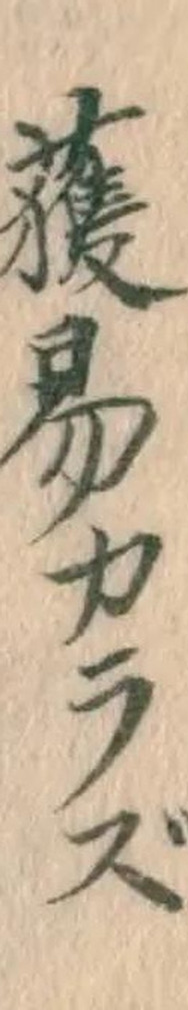獲易カラズ
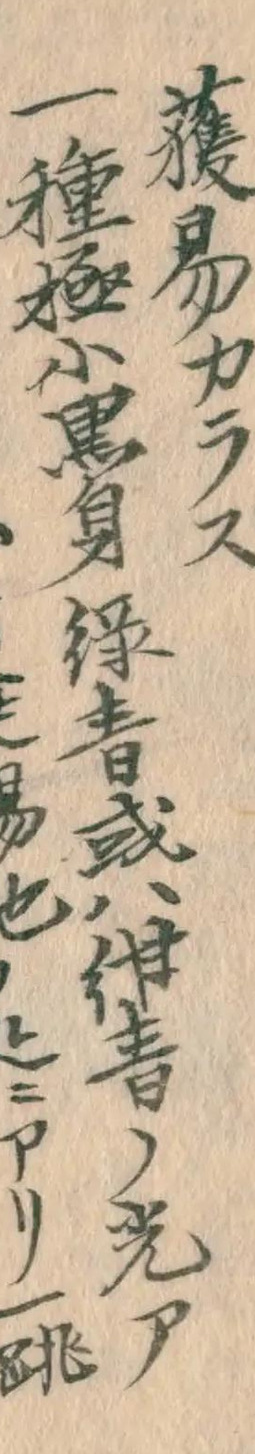一種極小黒身緑青或ハ紺青ノ光ア
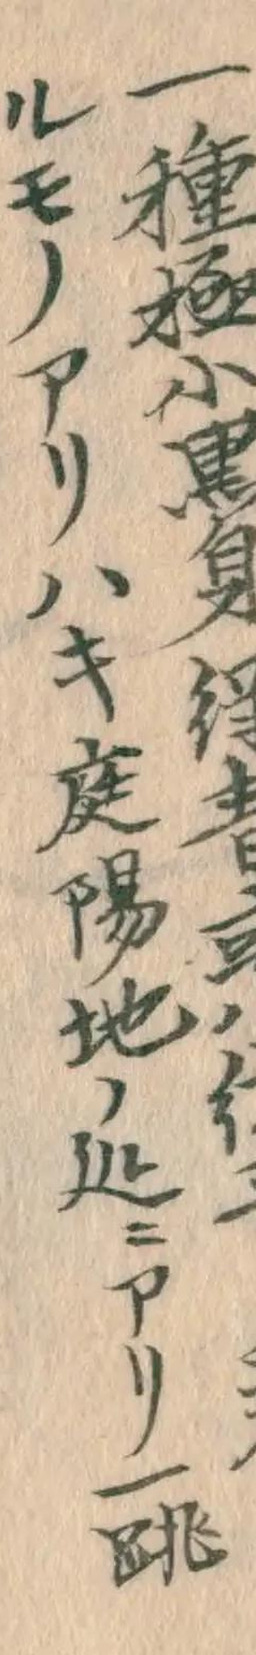ルモノアリハキ庭陽地ノ処ニアリ一跳
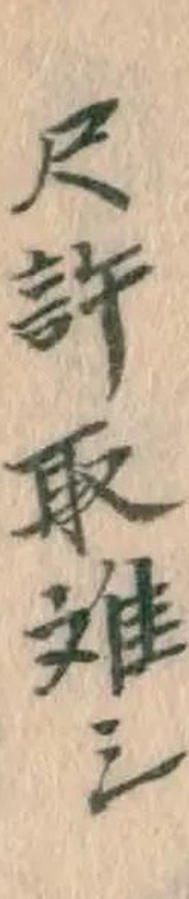尺許取難シ
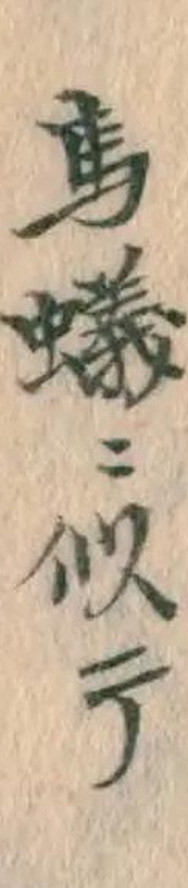馬蟻ニ似テ
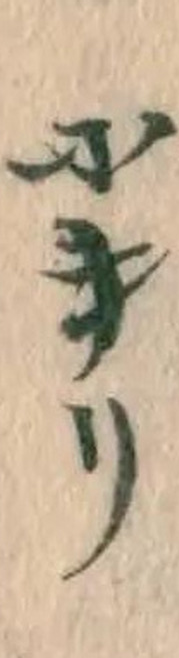小ナリ
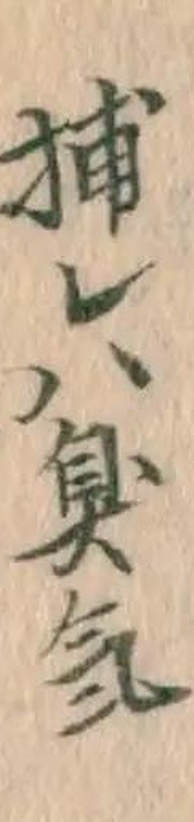捕レハ臭気
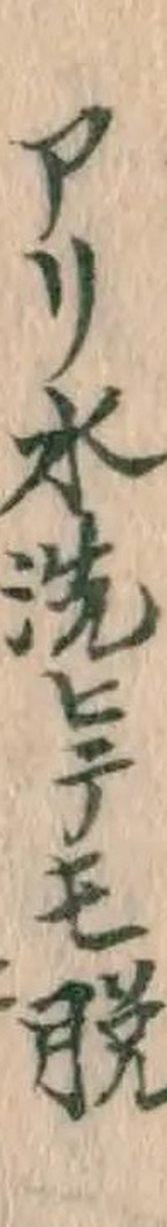アリ水洗ヒテモ脱
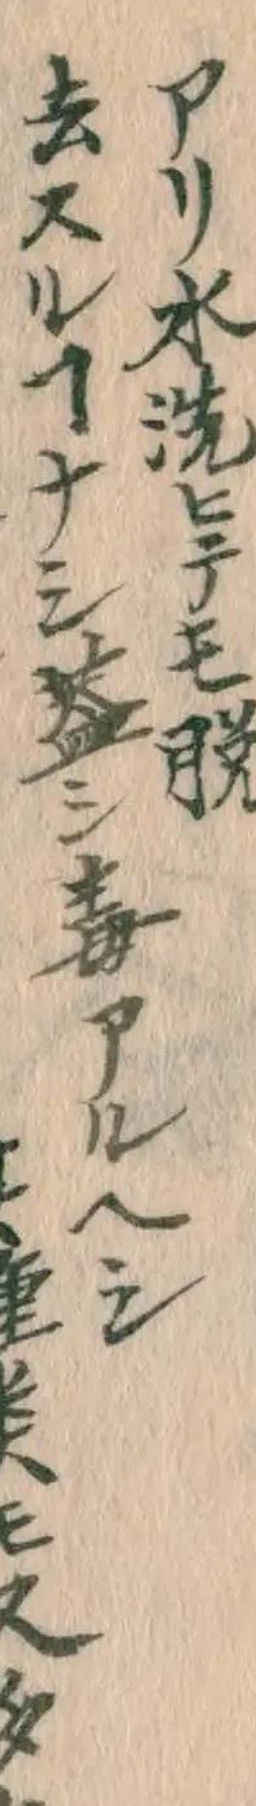去スルコトナシ蓋シ毒アルヘシ
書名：千蟲譜 3巻. [3]
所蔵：国立国会図書館 National Diet Library, JAPAN
